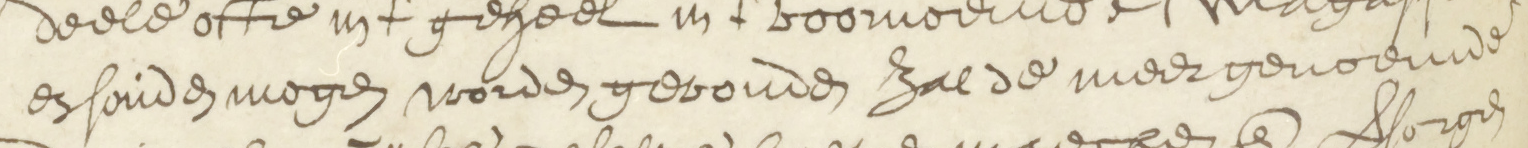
en souden mogen worden gevonden zal de meergenoemde
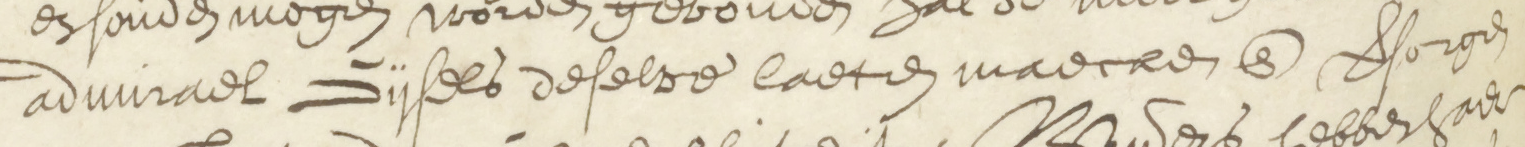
admirael Gijsels deselve laeten maecken & vsorgen
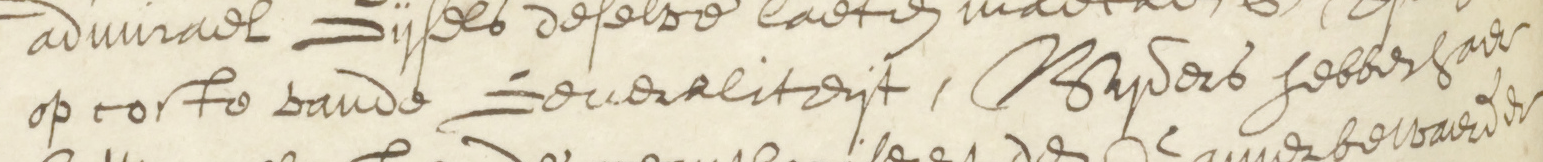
op coste vande Generaliteijt. Wyders hebben haer
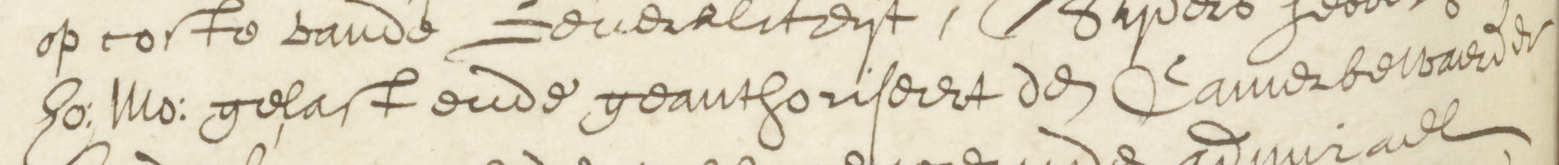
ho:Mo: gelast ende geauthoriseert den Camerbewaerder
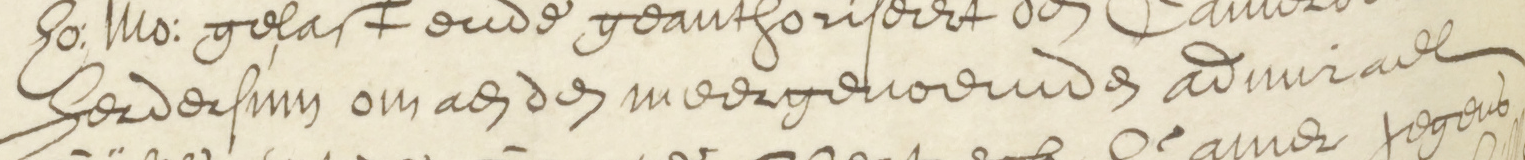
Herdersum om aen den meergenoemde admirael
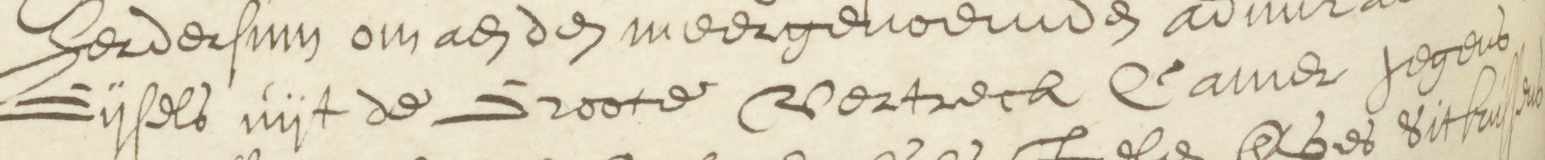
Gijsels uijt de Groote Vertreck Camer jegens
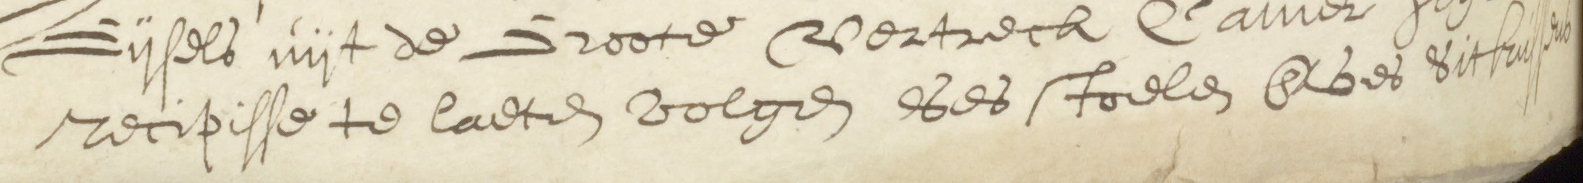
recipisse te laten volgen ses stoelen & ses sitkussens
